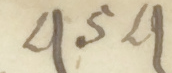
454
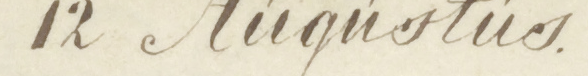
12 Augustus
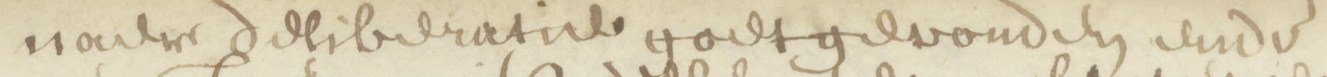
naer deliberatie goetgevonden ende
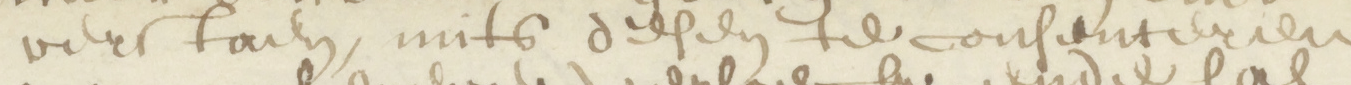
verstaen, mits desen te consenteren
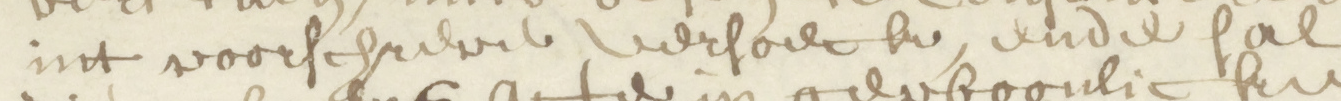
int voorschreve versoeck ende sal
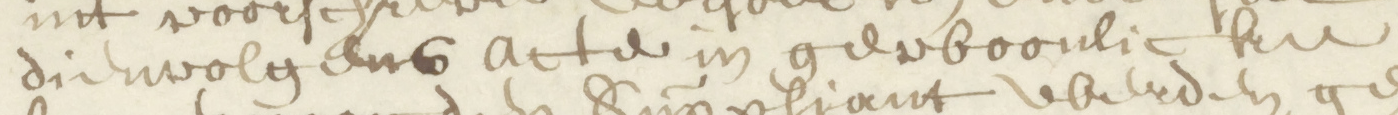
dienvolgens acte in gewoonlicke
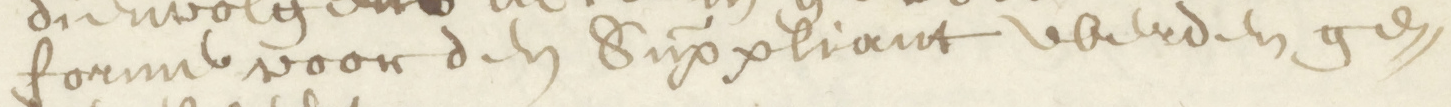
forme voor den Suppliant werden ge,,
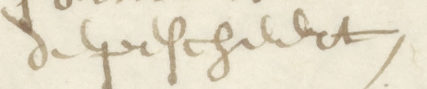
depescheert.
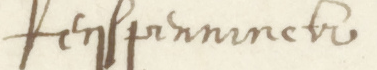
Reyspenninck
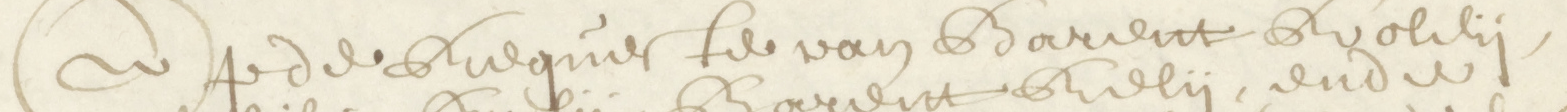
Opde requeste van Barent Roleij,
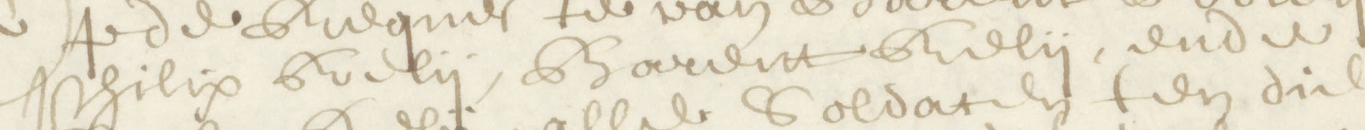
Philip Relij, Barent Relij, ende
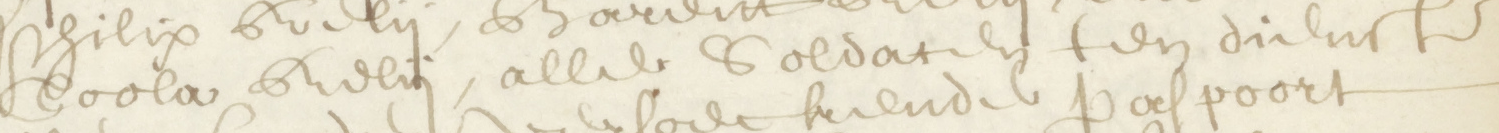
Toola Relij, alle soldaten ten dienste
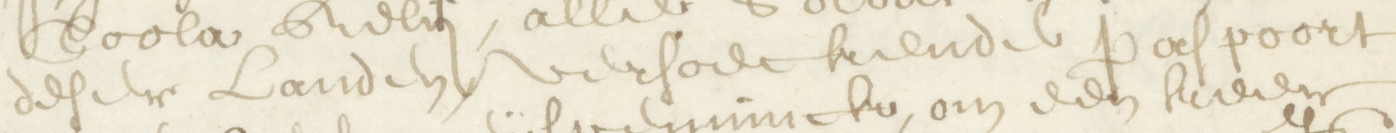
deser Landen, versoeckende paspoort
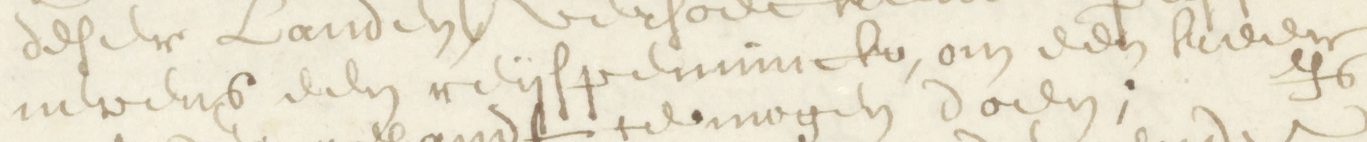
nevens een reijspenninck, om een keer
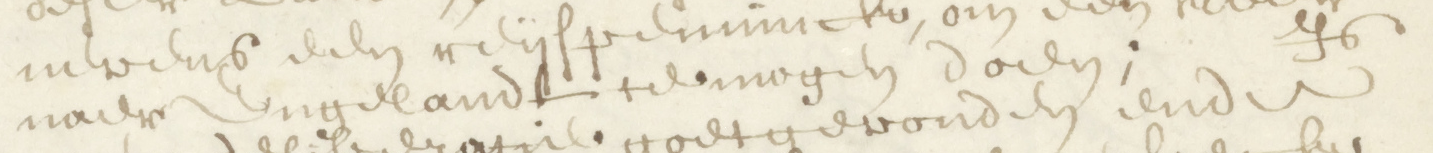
naer Engelandt te mogen doen: Is
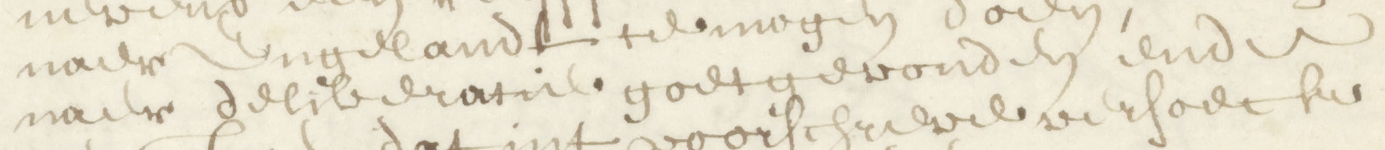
naer deliberatie goetgevonden ende
